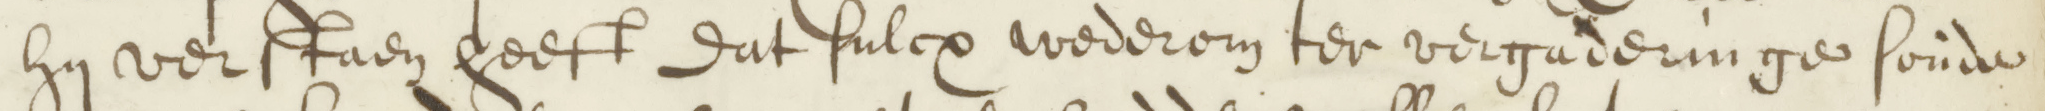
hy verstaen heeft dat sulcx wederom ter vergaderinge soude
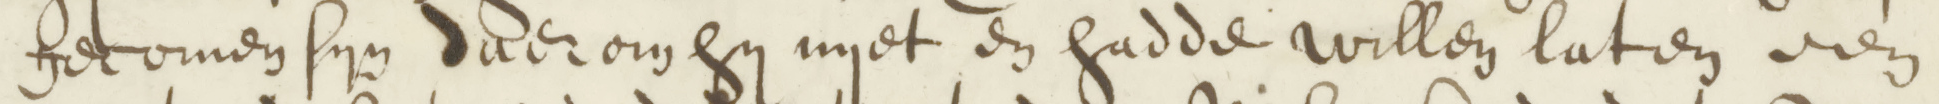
gecomen syn daerom hy nyet en hadde willen laten een
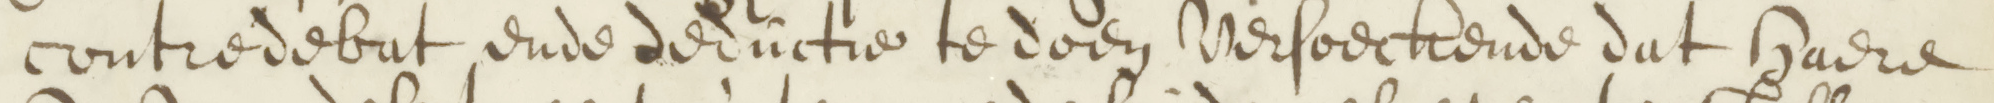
contredebat ende deductie te doen Versoeckende dat Haere
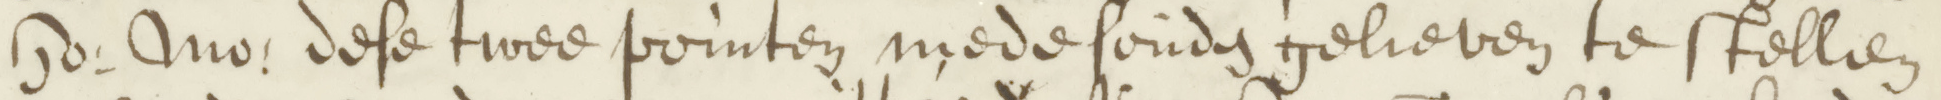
Ho:Mo: dese twee pointen mede souden gelieven te stellen,
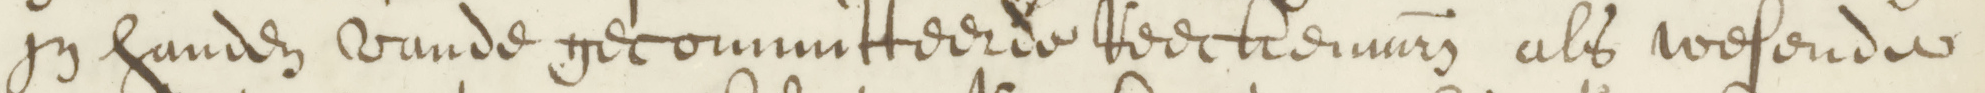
in handen vande gecommitteerde Reeckenmrs als wesende
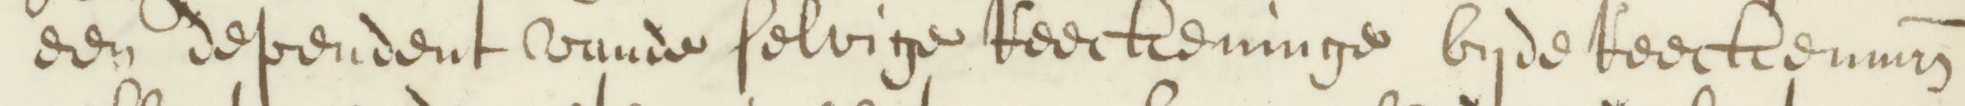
een dependent vande selvige Reeckeninge byde Reeckenmrs
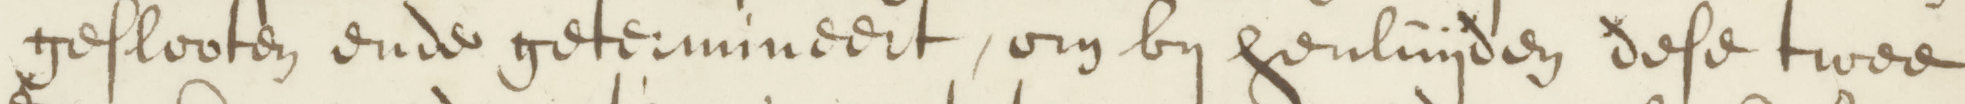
geslooten ende getermineert, om by henluijden dese twee
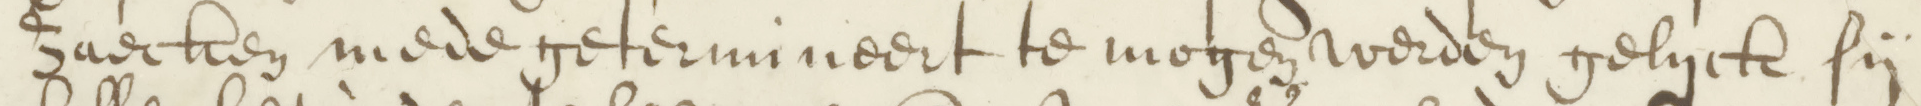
zaecken mede getermineert te mogen werden gelyck sij
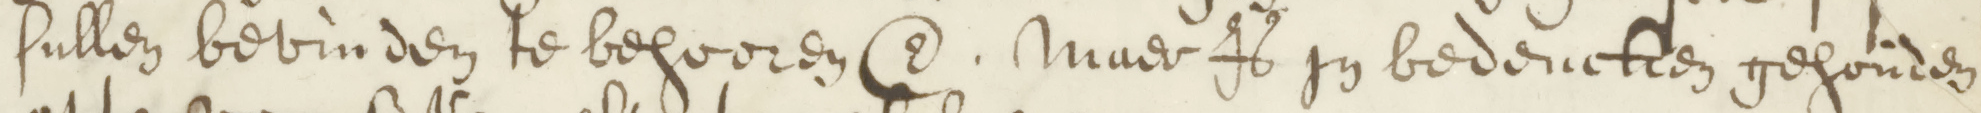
sullen bevinden te behooren @. Maer Is in bedencken gehouden
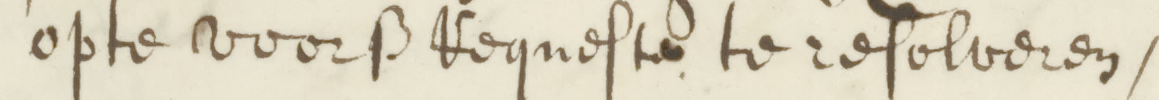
opte voors Requeste te resolveren.
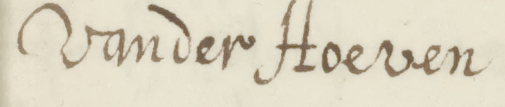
Vander Hoeven
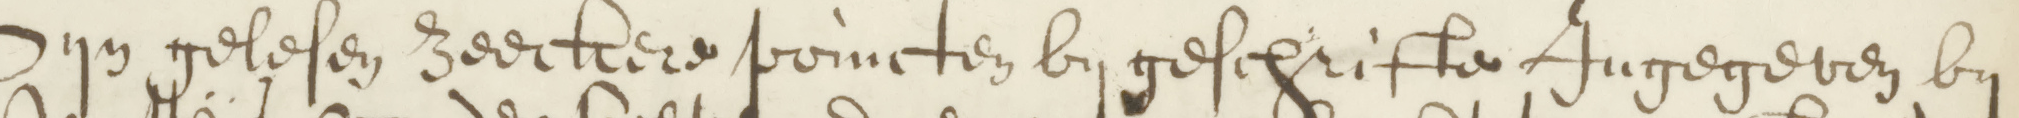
Syn gelesen zeeckere poincten by geschrifte Ingegeven by
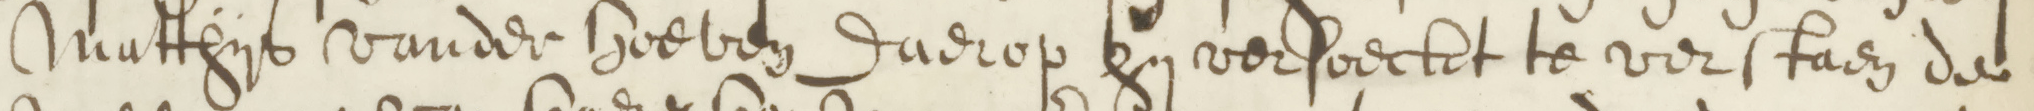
Matthijs vander Hoeven daerop hy versoeckt te verstaen de
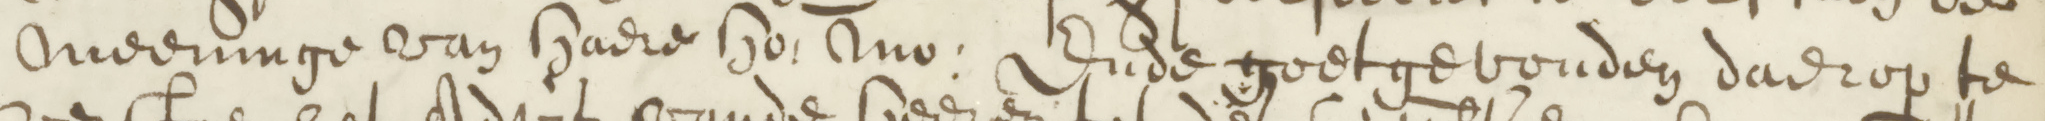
meeninge van Haere Ho:Mo: Ende goetgevonden daerop te
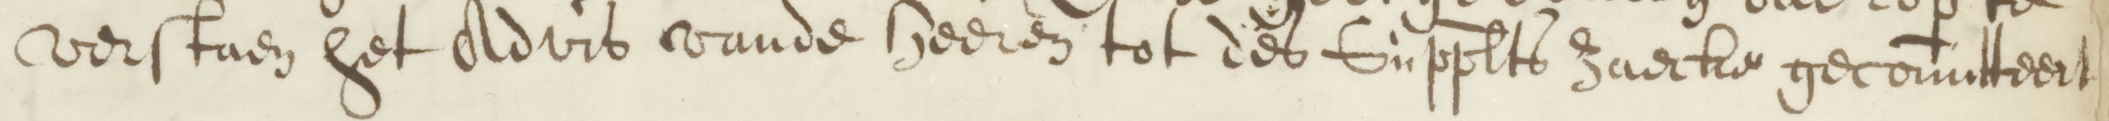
verstaen het Advis vande Heeren tot des Supplts zaecke gecomitteert
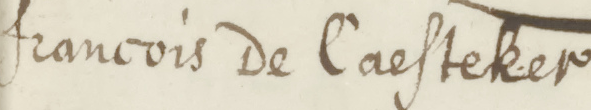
Francois de Caesteker
